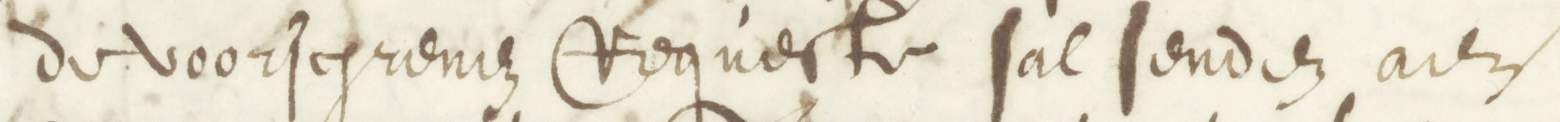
de voorschreuen Requeste sal senden aen
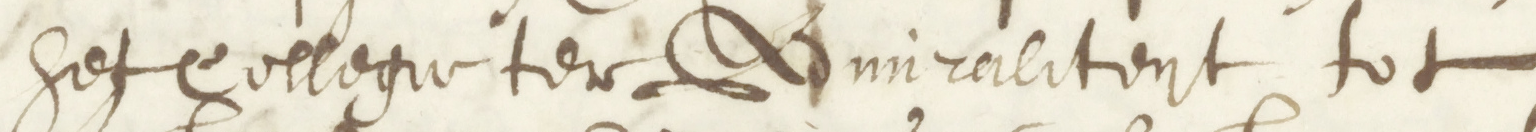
het collegie ter Admiraliteyt tot
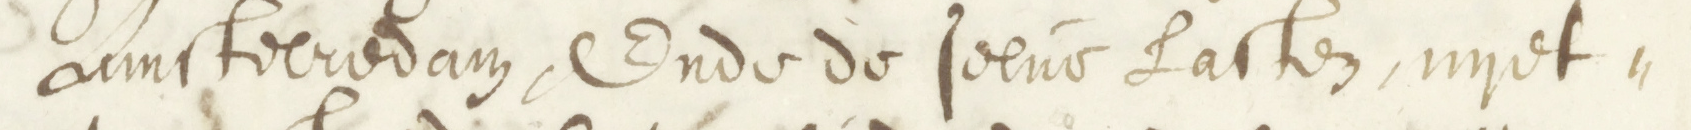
amstelredam, Ende de selue lasten, nyet,,
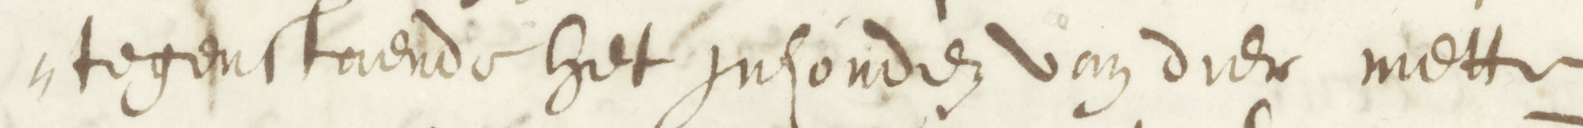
,,tegenstaende het inhouden van dier mette
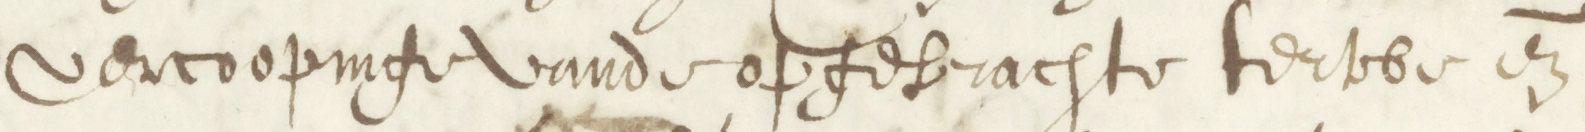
vercoopinge vande opgebrachte terwe en
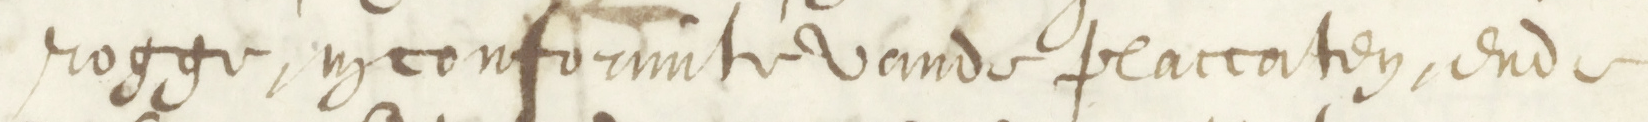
rogge, in conformite vande placcaten, ende
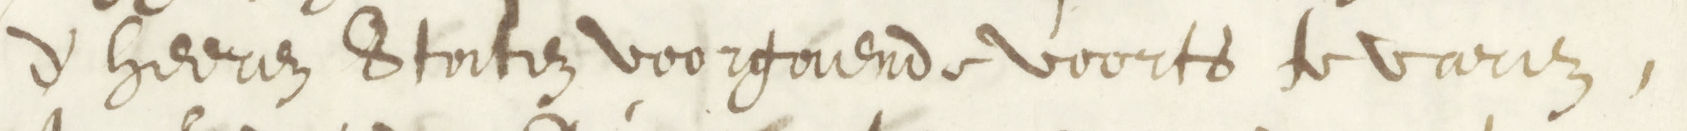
d'heeren Staten voorgaende voorts te varen,
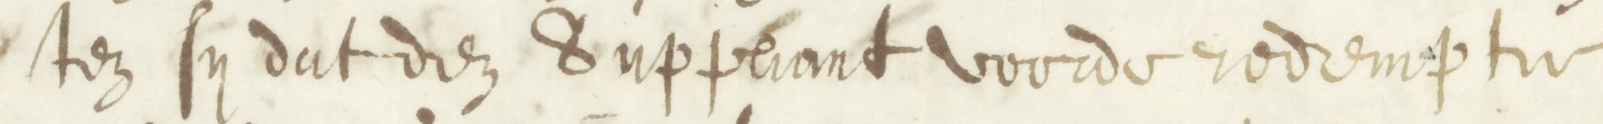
ten sy dat den Suppliant voorde redemptie
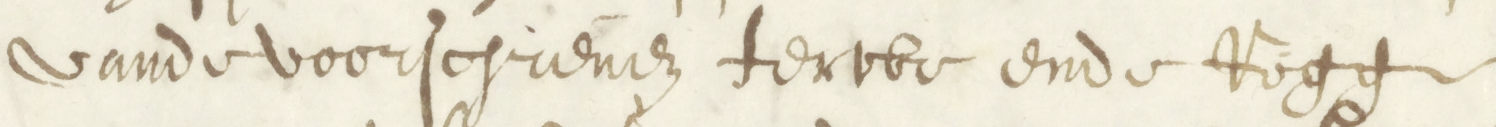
vande voorschreuen terwe ende Rogge
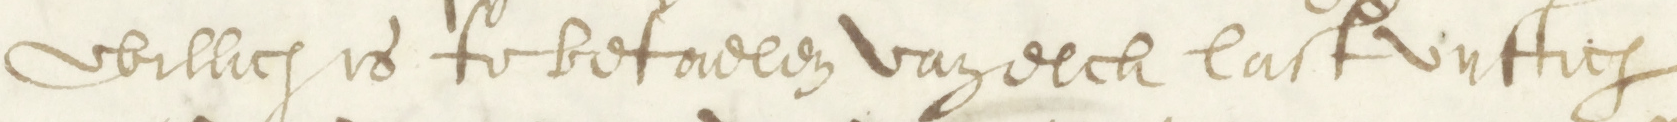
willich is te betaelen van elck last vyftich
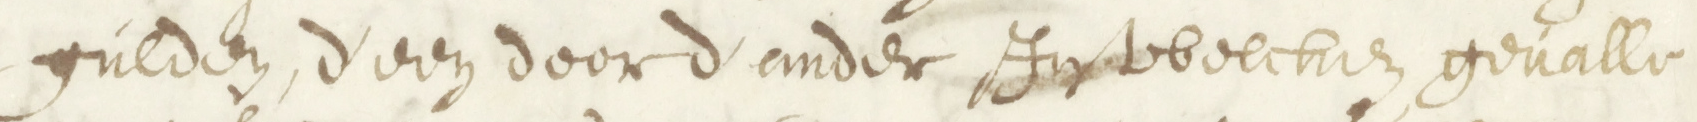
gulden, d'een door d'ander, In welcken geualle
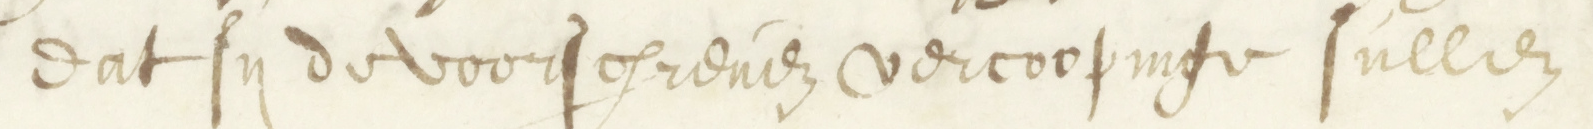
dat sy de voorschreuen vercoopinge sullen
